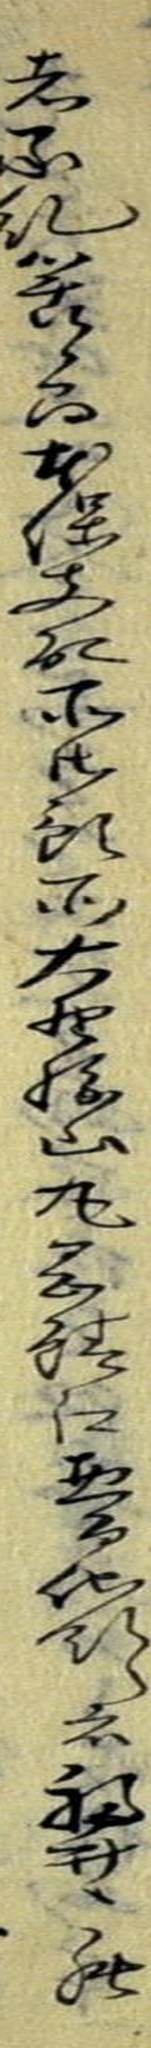者承糺筈候間本保支配所御預所大野勝山丸岡鯖江惣而他領之者福井へ罷
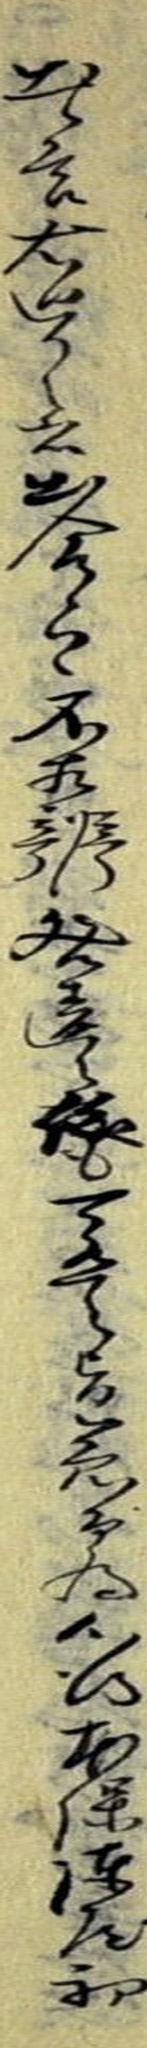出候節右廻り之者出合候ハヽ不相弁咎違之儀も可有之旨兼而及心得本保陣屋初
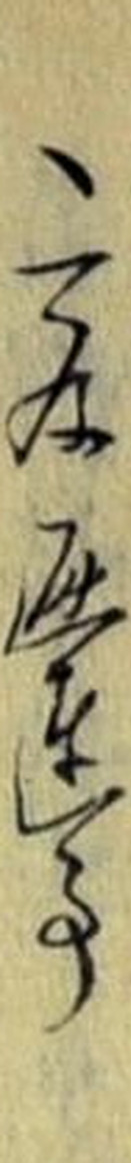へ可及通達事
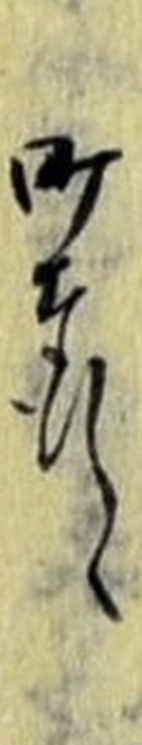町奉行へ
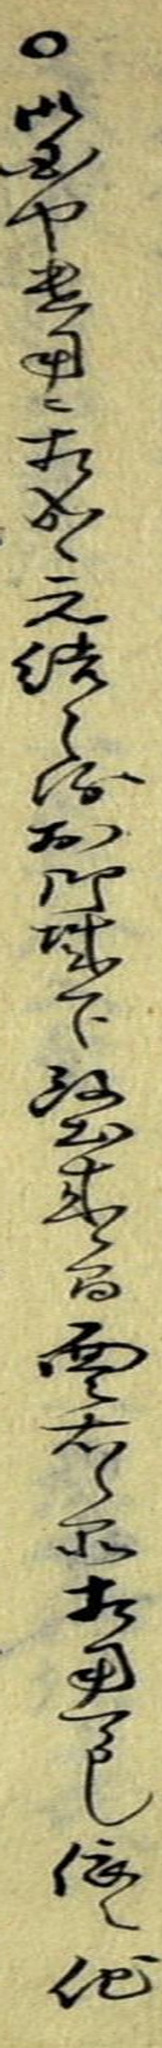○御国中遣用ニ相成候元結之儀於城下致出来候間面々右之品相用可申候依之他
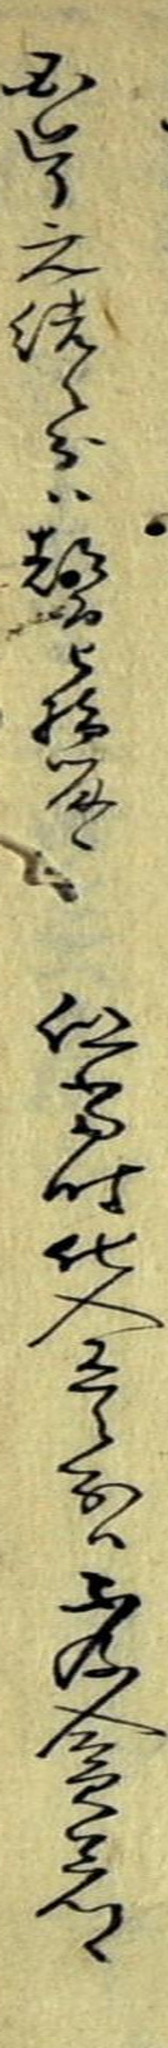国廻り元結之分ハ都而被指留候但当時他入有之分ハ不及貪着候

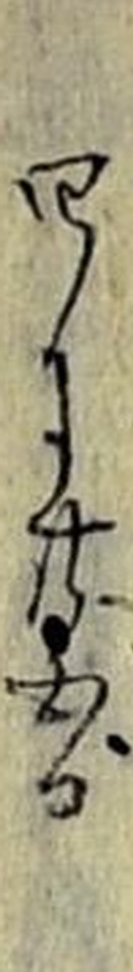四月廿五日
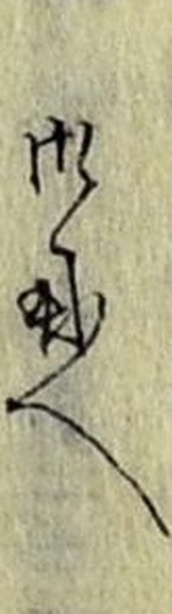御用人
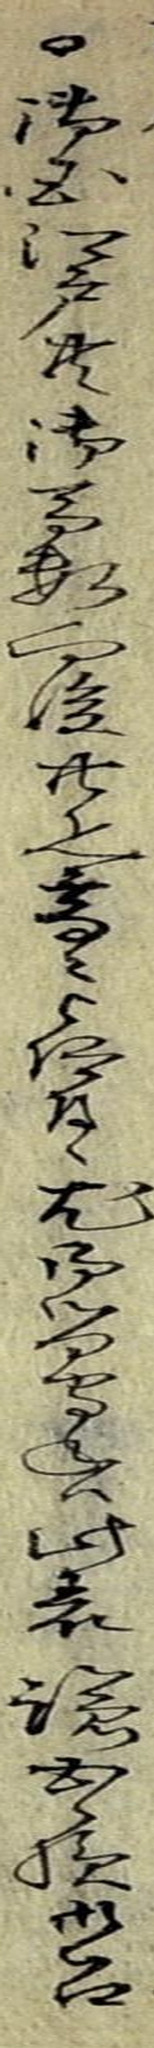○御国江戸共御馬数向後廿疋高ニ被仰付候尤御留守年ハ此表謙五郎様御召
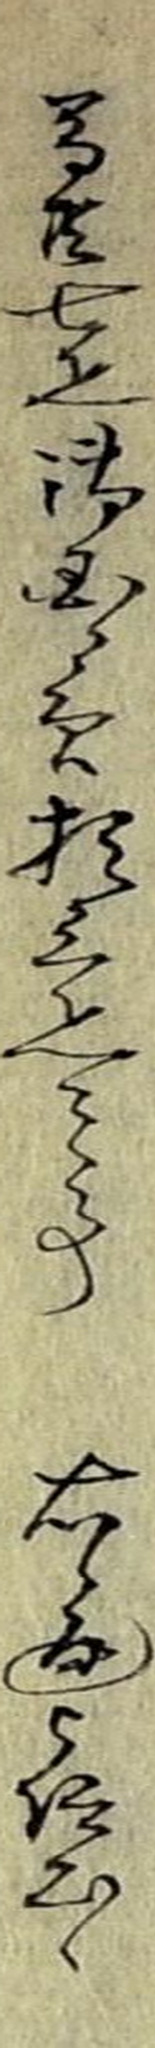馬共七疋御国ニ候而ハ拾三疋ニ候事右之通被仰出候
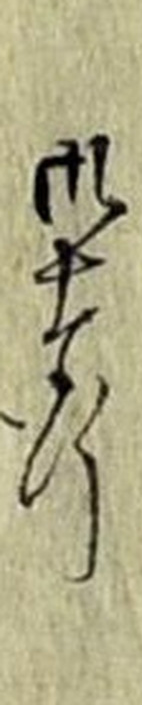御奉行
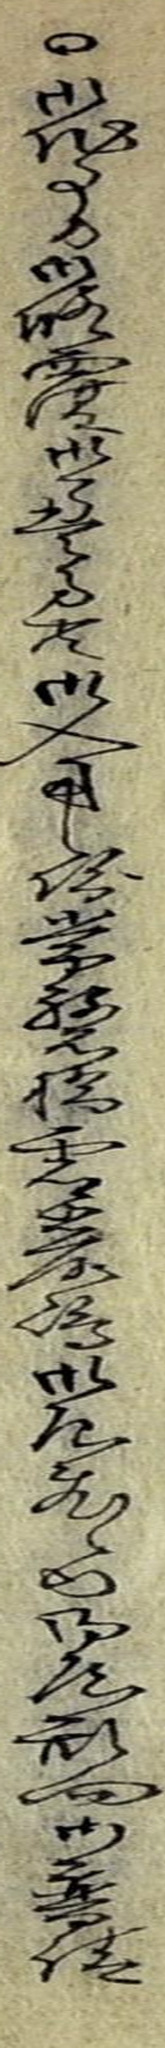○御作事方御修覆御畳方共御入用之儀常磐橋霊巌島御屋敷之内御屋形向御普請
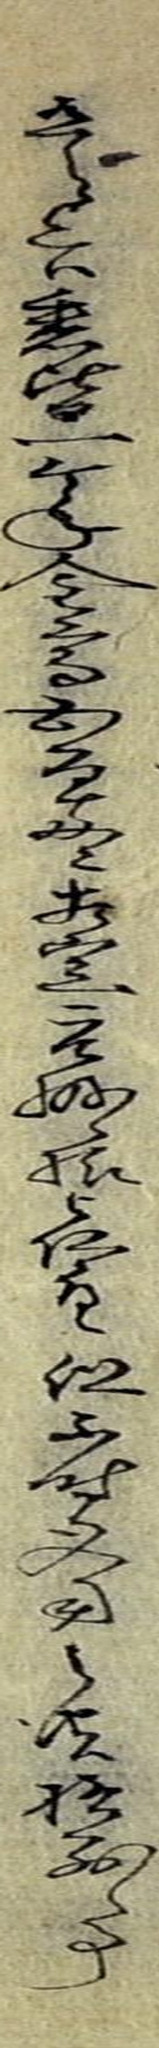有之迄ハ悉皆一ケ年金高五百両ニ相定取扱候様被仰付候但不時御入用之儀ハ格別候事
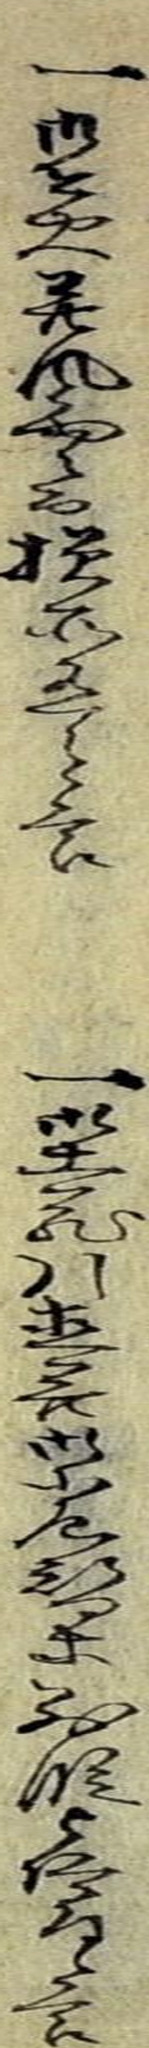一御近火并風雨ニ而損所有之候節一御土蔵引直并御小屋替等別段被仰付候節
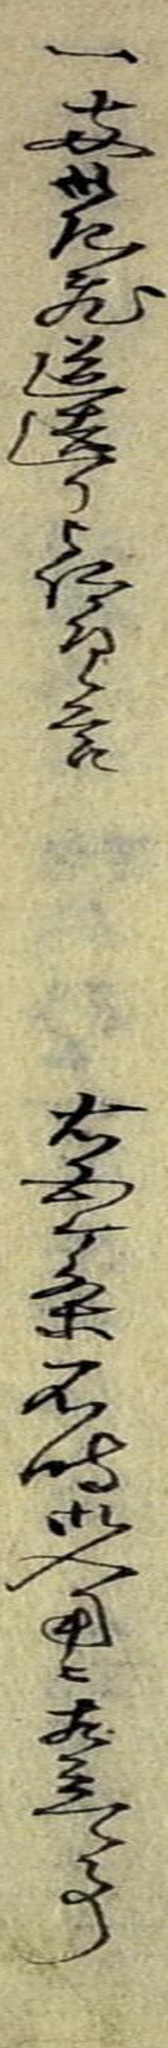一両御屋敷道造り被仰付候節右五ケ条不時御入用ニ相立候事
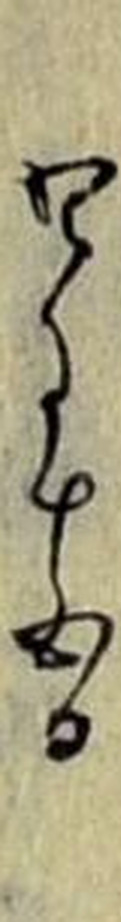四月十五日
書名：命令之部 五
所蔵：福井県文書館 Fukui Prefectural Archives
